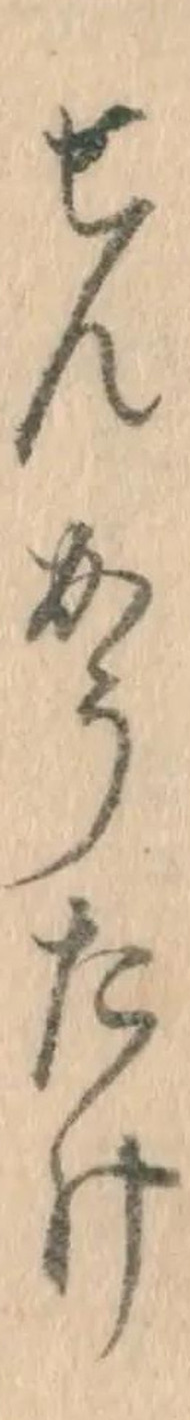せんかうたけ
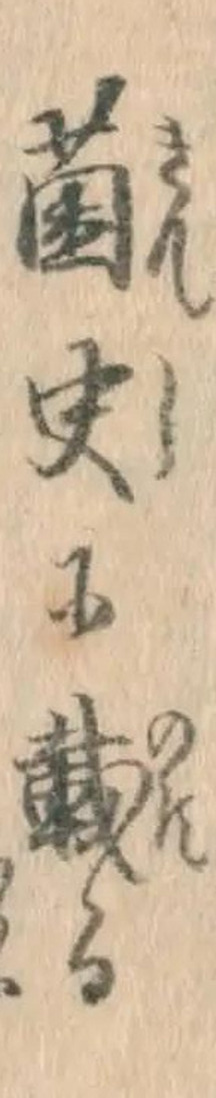菌史に載る
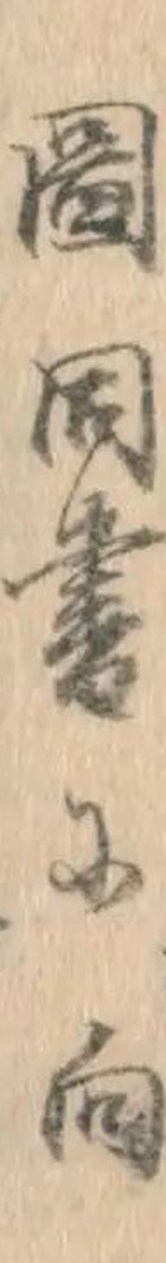図同書に向
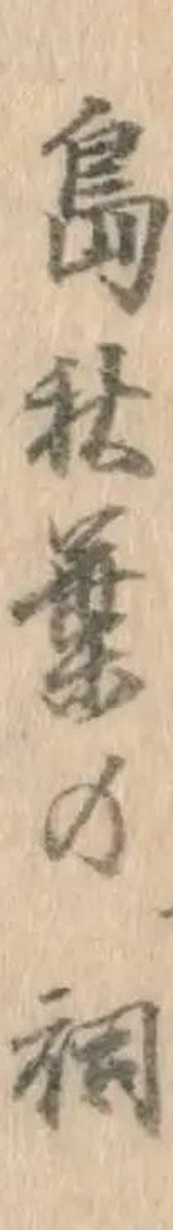島秋葉の祠
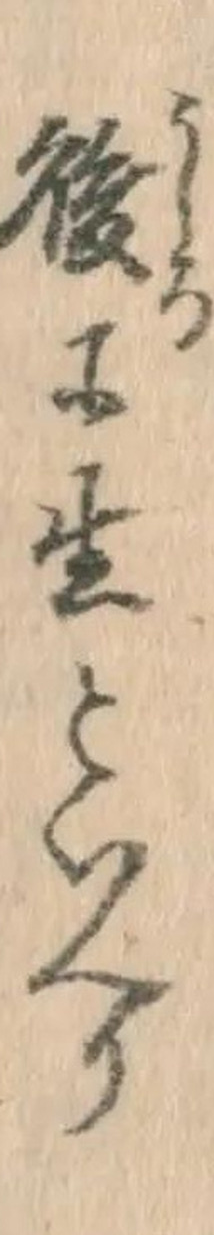後に生といへり
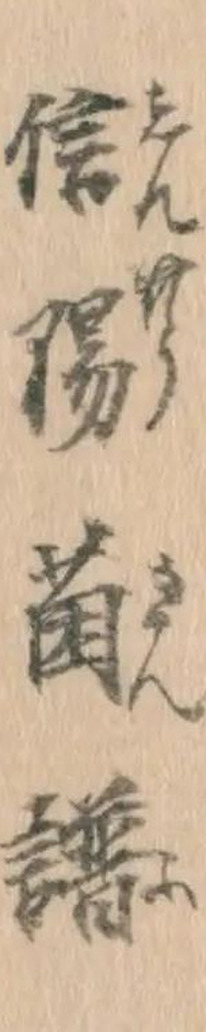信陽菌譜
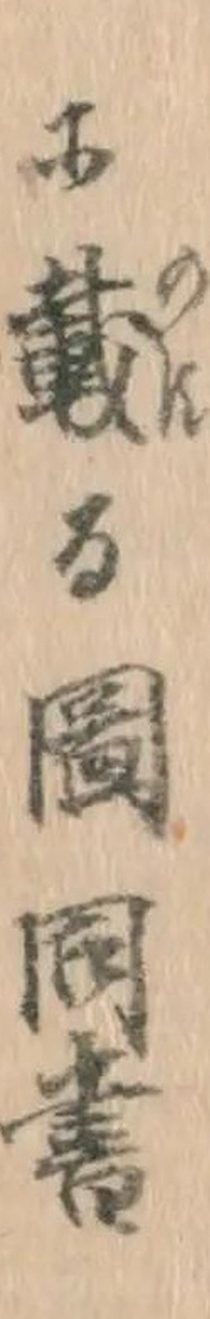に載る図同書
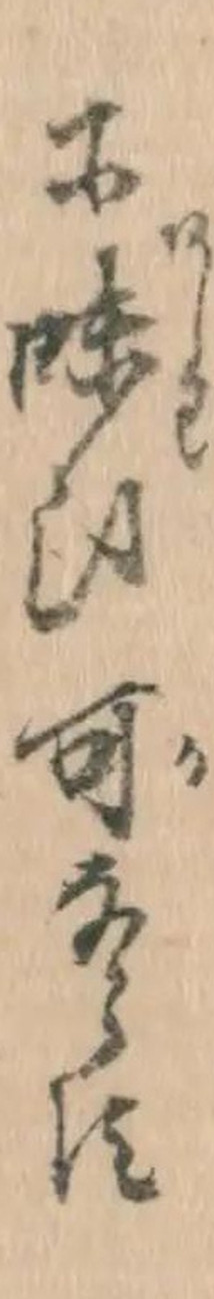に味ひ可ならす
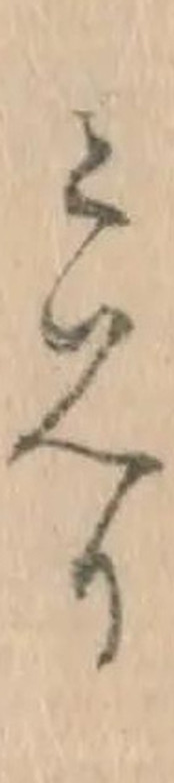といへり

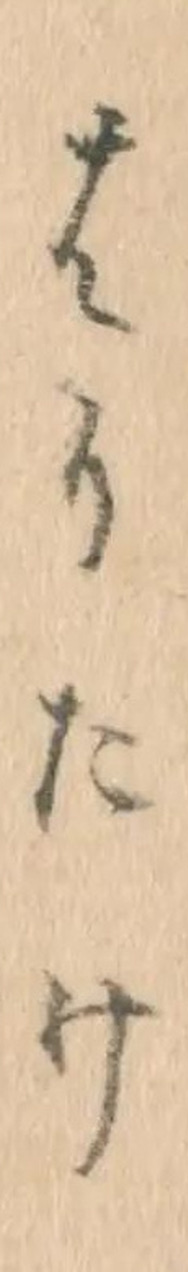はりたけ
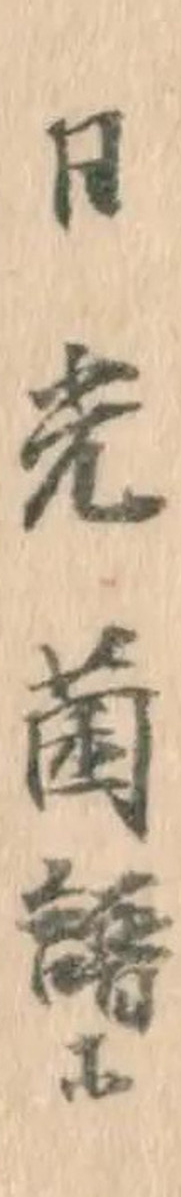日光菌譜に
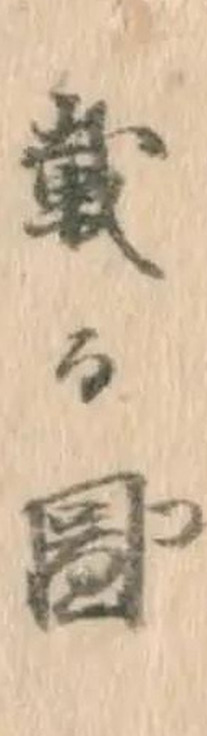載る図
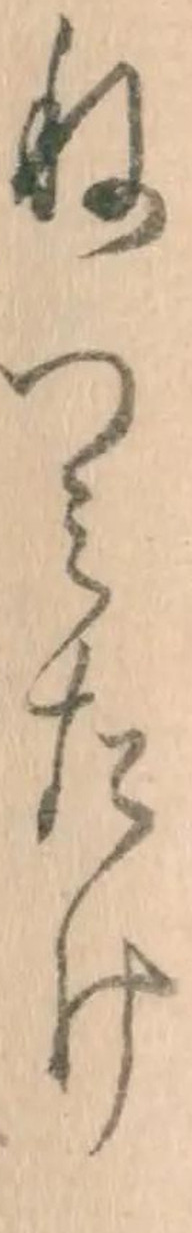ねつみたけ
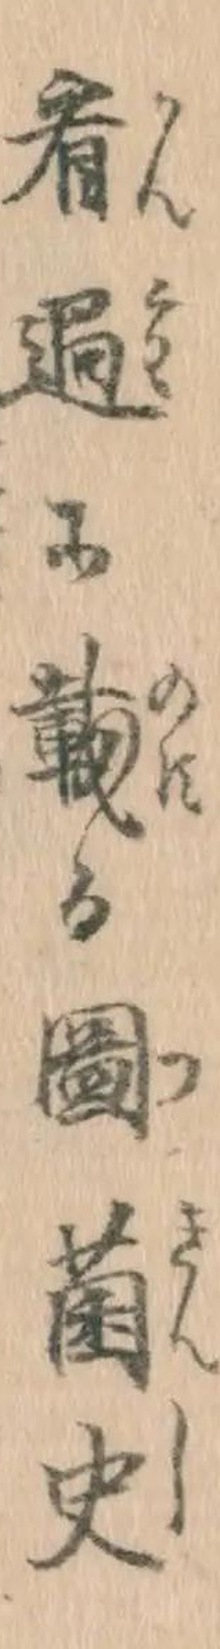看過に載る図菌史
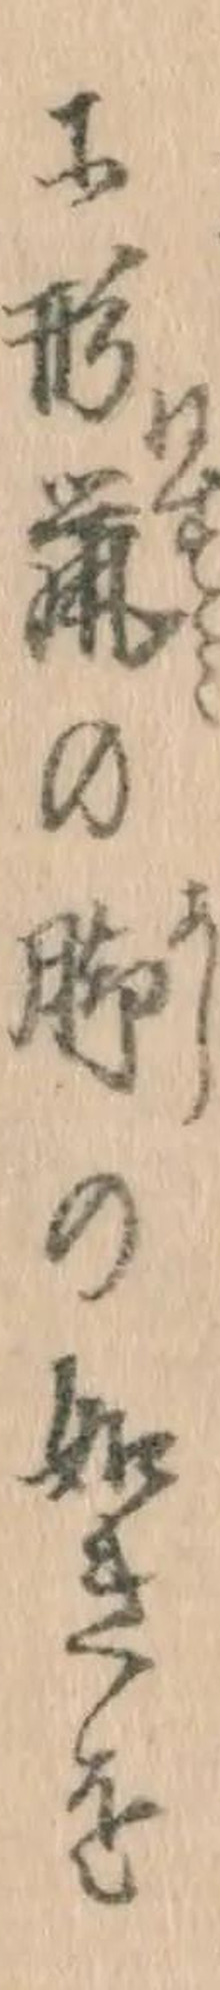に形鼠の脚の如きを
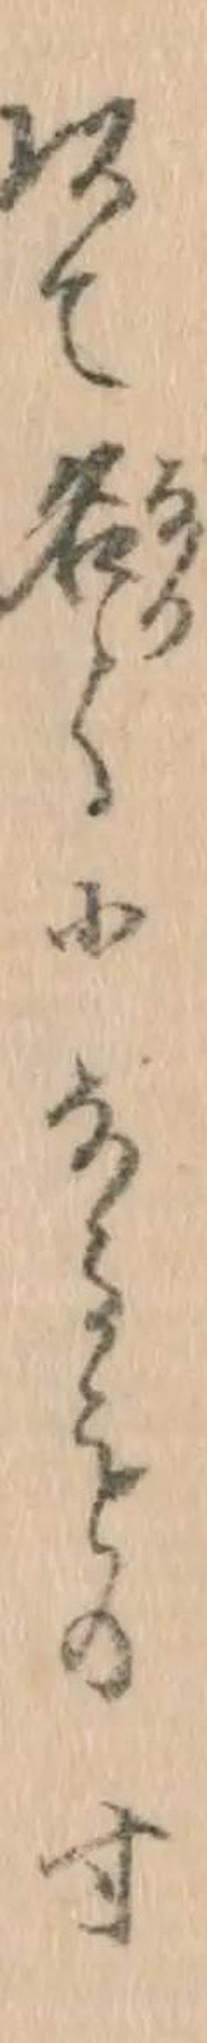以て名く小なるもの寸
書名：本草図譜. 巻58-60
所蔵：国立国会図書館 National Diet Library, JAPAN
